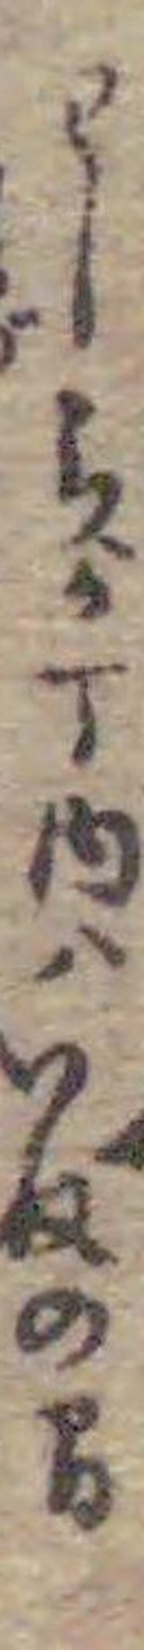わしらが丁内はいぬ？の間
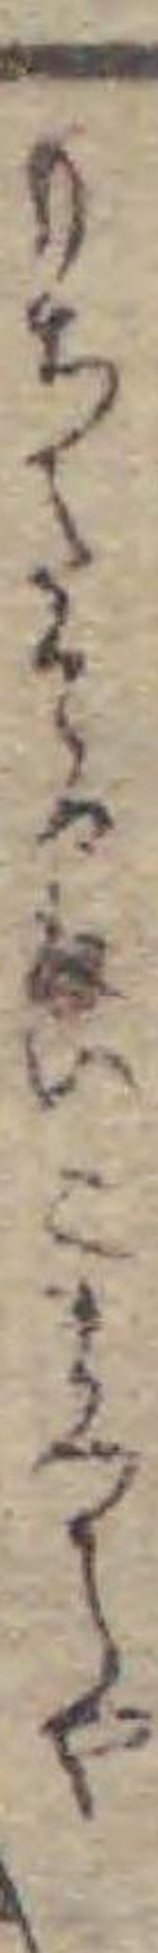もちたてるたいこまつしや
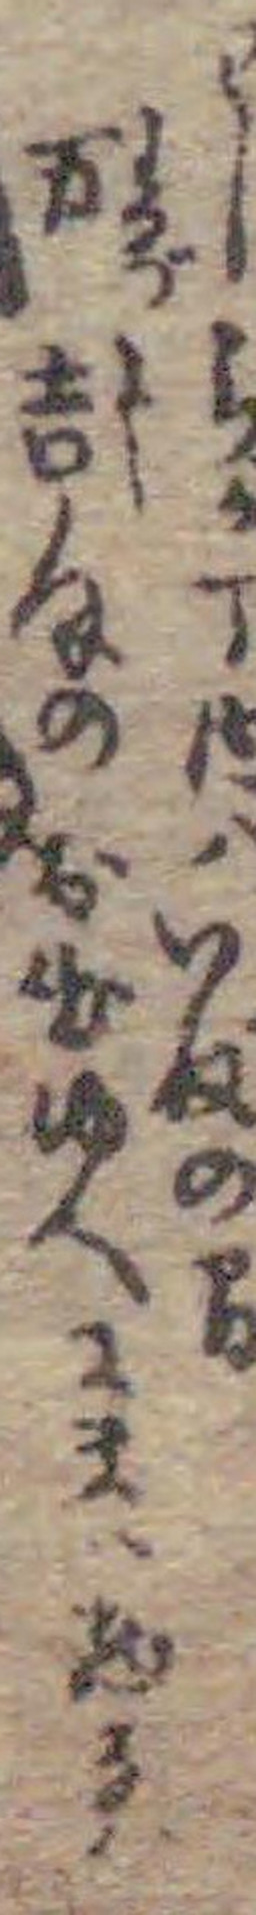万吉様のお出ゆへに？ま物な？
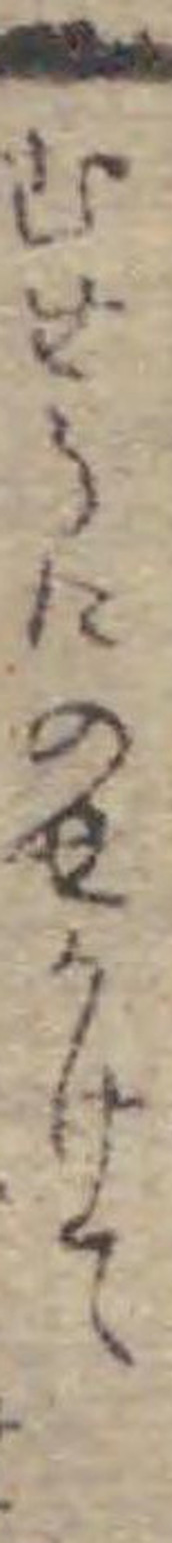むせうにのせかけて
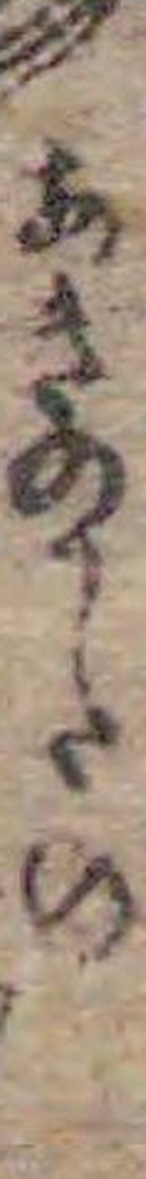あきのかたの
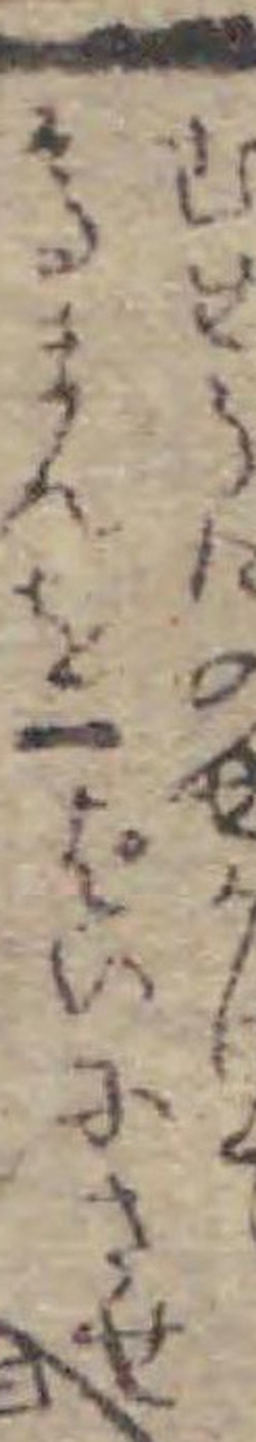高まんを一ばいにさせ
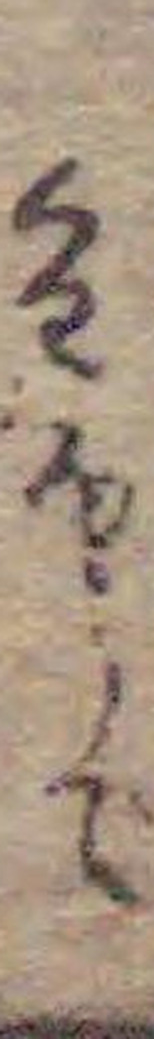くわほうで
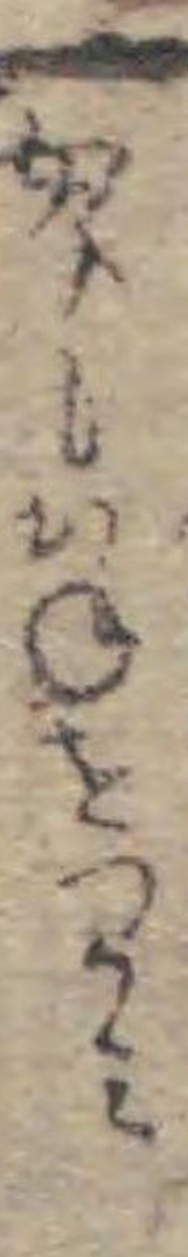女郎のかねをつかみ
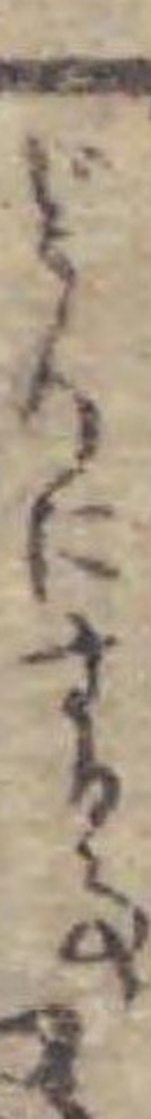どりにする事
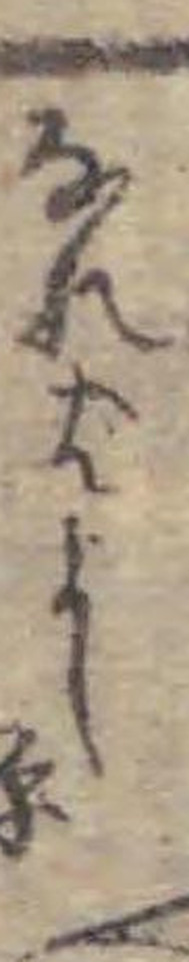なればよし原
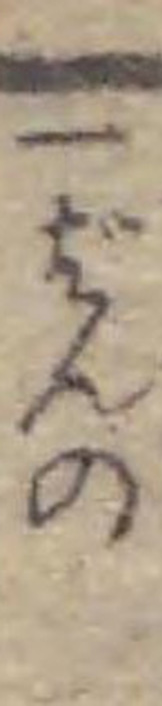一ばんの
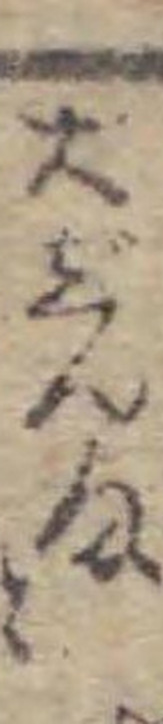大じんか
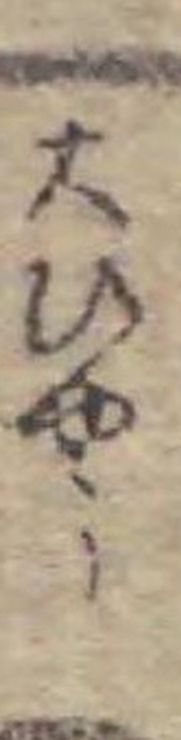大ひやう
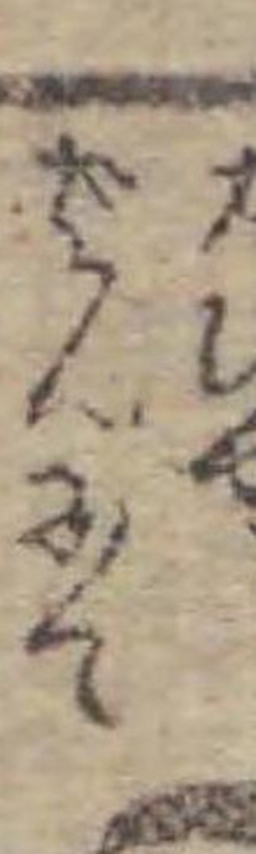ばんにて
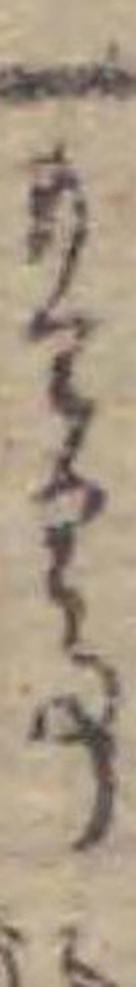もてる事
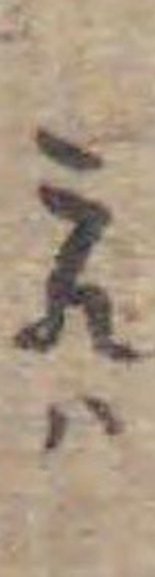これは
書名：鼻峰高慢男 : 2巻
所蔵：国立国会図書館 National Diet Library, JAPAN
